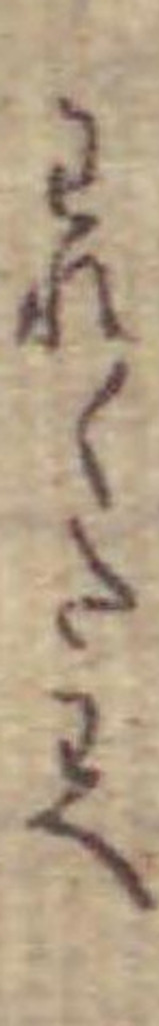われ〱たわへ

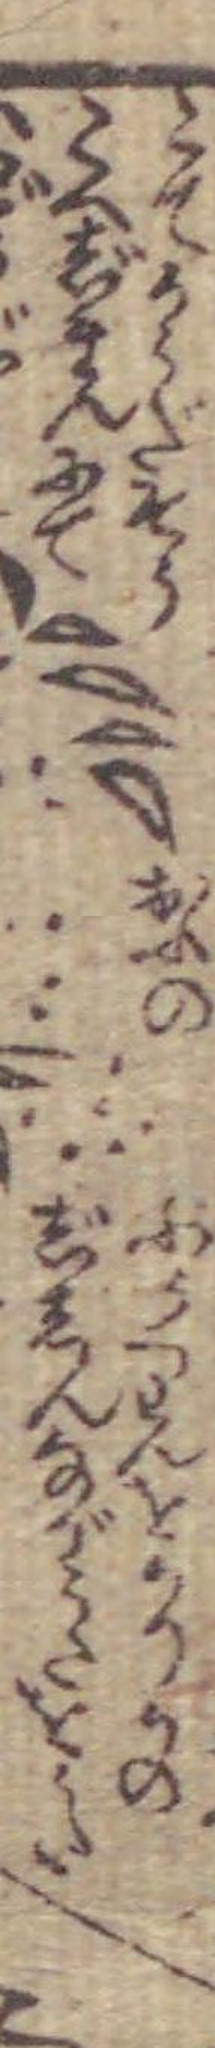こへじまんにてじしんながうたをうた
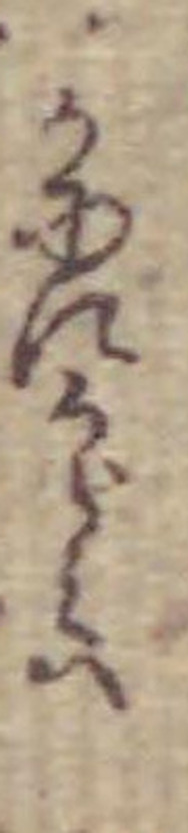かににうらみは
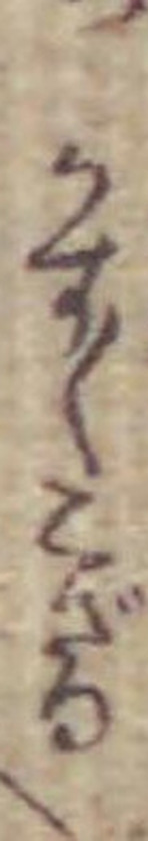かす〱こざる
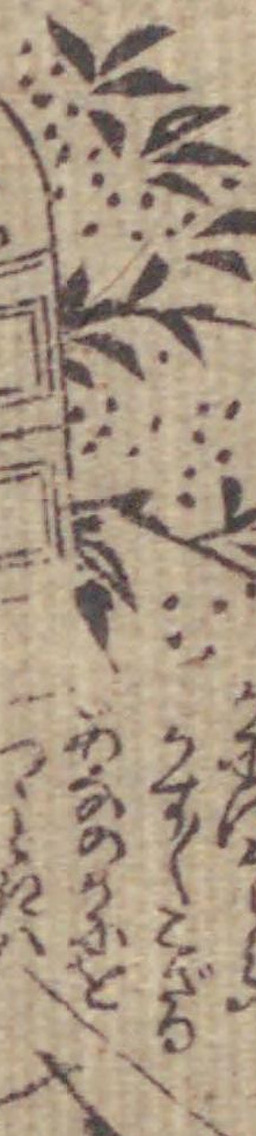あなのかにを
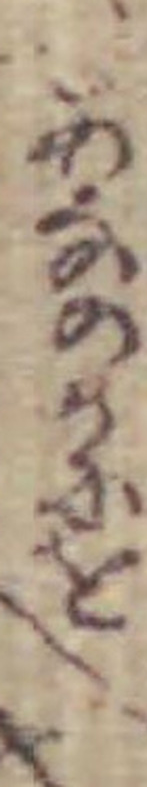あなのかにを
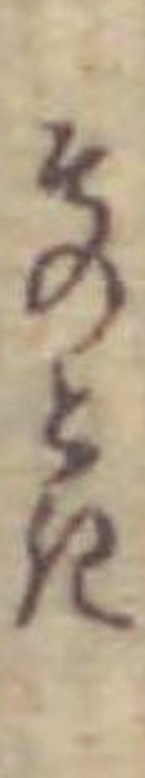そのとき
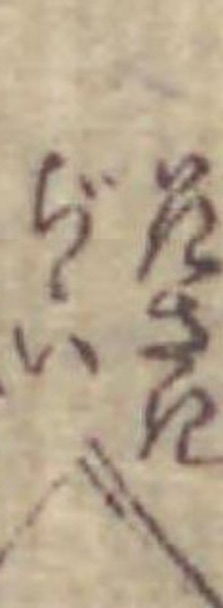ぢゝい
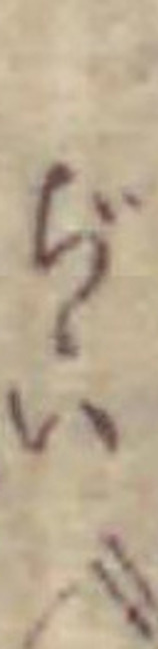ぢゝい
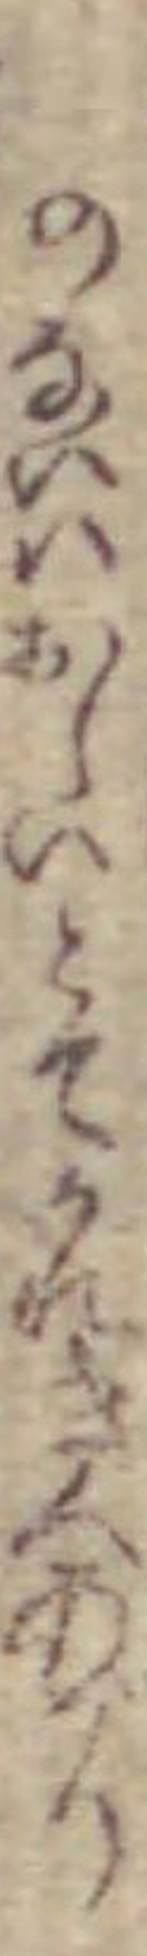のないはおしいとてかれきへあがり
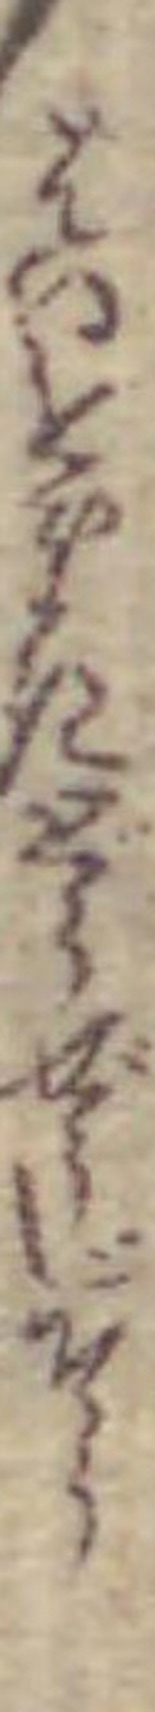はいをまきどうぜうじう
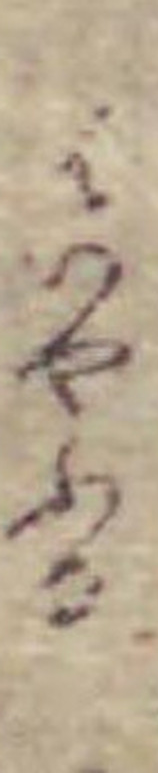はいやふる

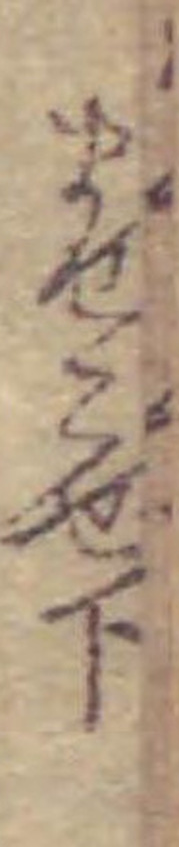まぜこぜ下
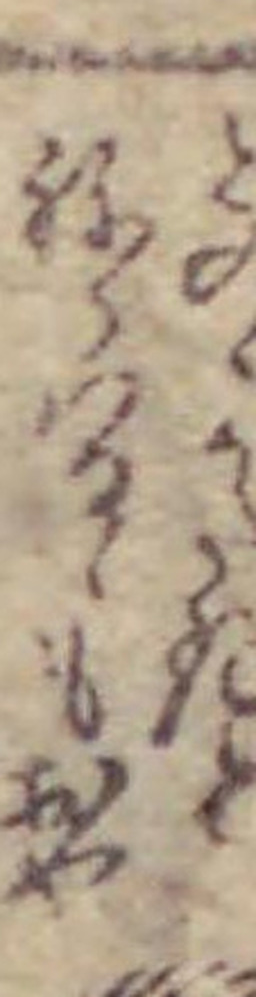ねらはるゝもは
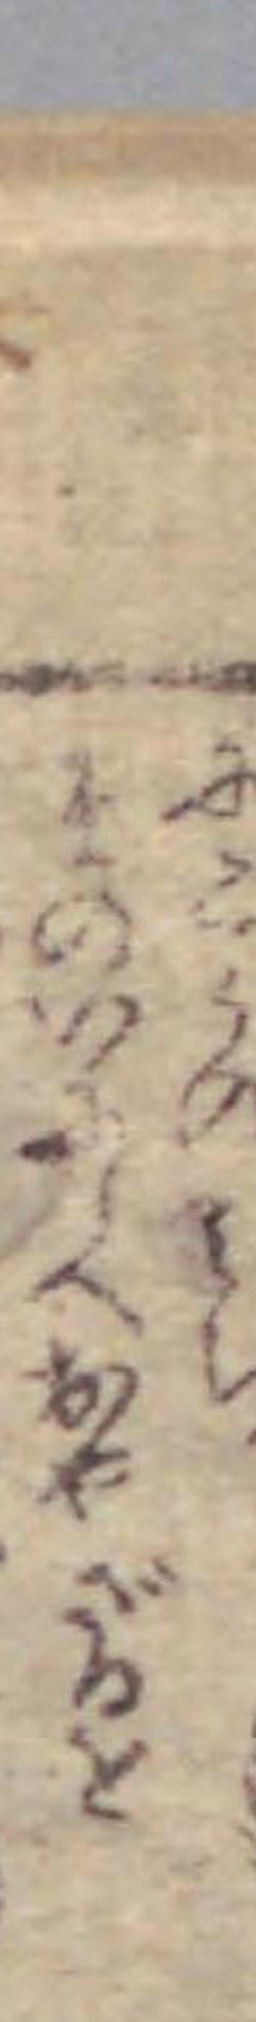そのいにしへおやざるをの
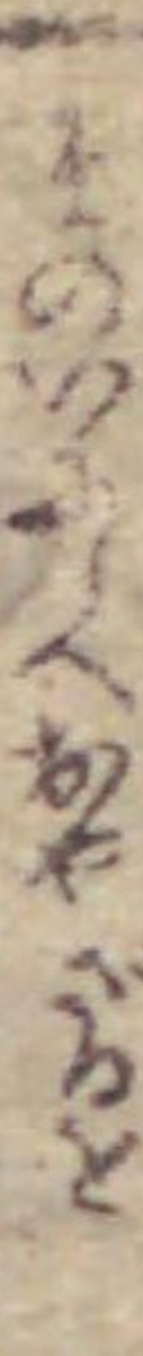そのいにしへおやざるをの
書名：交古勢昔咄 : 2巻
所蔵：国立国会図書館 National Diet Library, JAPAN
